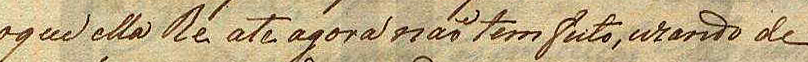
o que ella Re ate agora naõ tem feito, uzando de
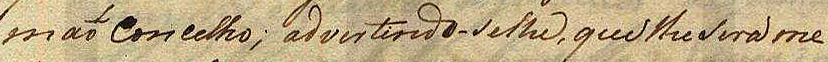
maó concelho; advertindo-selhe, que lhe sera me
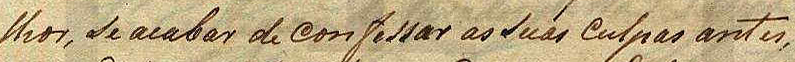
lhor, se acabar de confessar as suas culpas antes,
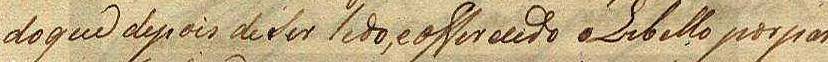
do que depois de ser lido, e offerecido o Libelo, por par
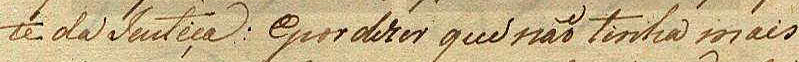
te da Iustiça: E por dizer que naõ tinha mais
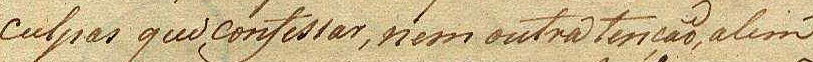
culpas que confessar, nem outra tençaõ, alem
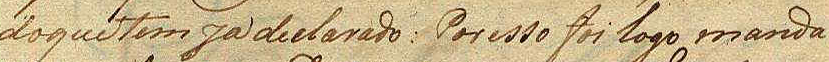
do que tem ja declarado: Por esso foi logo manda
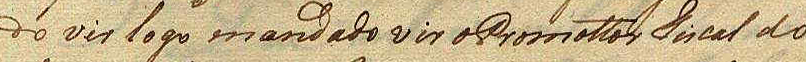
do vir logo mandado vir o Promottor Fiscal do
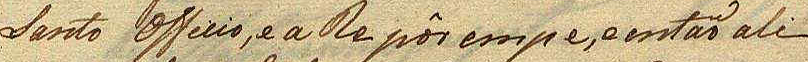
Santo Officio, e a Re pôr em pe, e entaõ ali
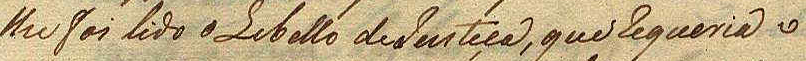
lhe foi lido o Libello de Iustiça, que Requeria o
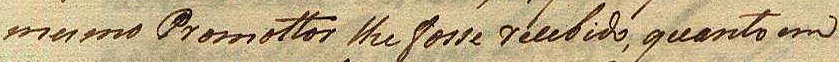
mesmo Promottor lhe fosse recebido, quanto em
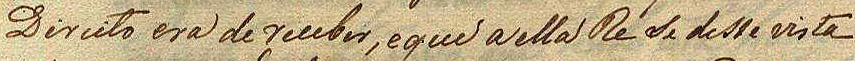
Direito era de receber, e que a ella Re se desse vista
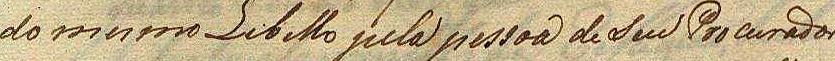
do mesmo Libello pela pessoa do seu Procurador
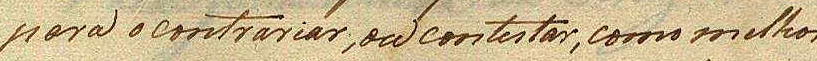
para o contrariar, ou contestar, como melhor
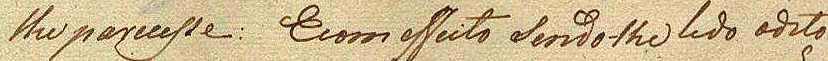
lhe parecesse: E com effeito sendo-lhe lido o dito
